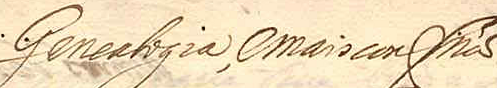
Genealogia, E mais confissaõ
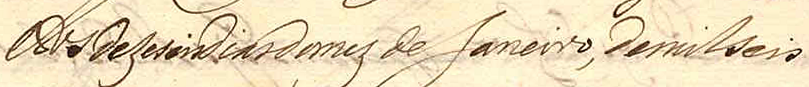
Aos dezeseis dias do mez de Janeiro, de mil seis
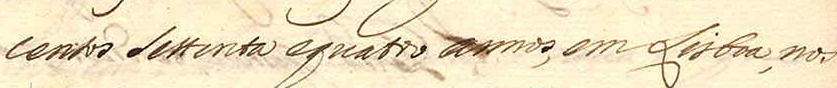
centos settenta e quatro annos, em Lisboa, nos
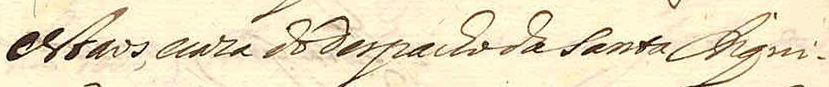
estaos, e caza do despacho da Santa Inqui
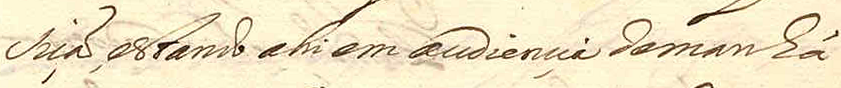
siçaõ, estando ahi em audiencia da manhã
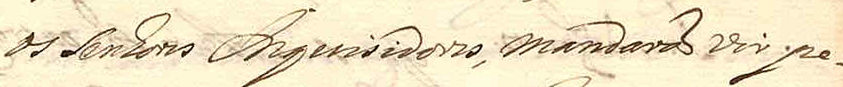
os senhores Inquisidores, mandarão vir pe
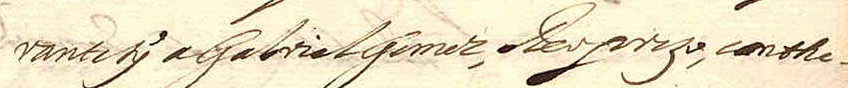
rante sy a Gabriel Gomez, Reo prezo, conthe
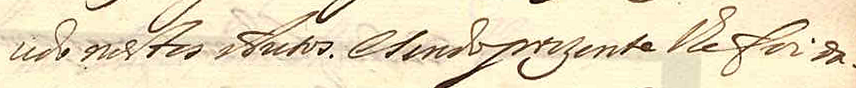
udo nestes Autos. E sendo prezente lhe foi da
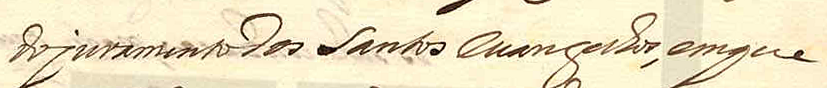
do juramento dos santos euangelhos, em que
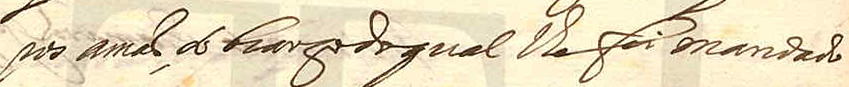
pos a maõ, sob cargo do qual lhe foi mandado
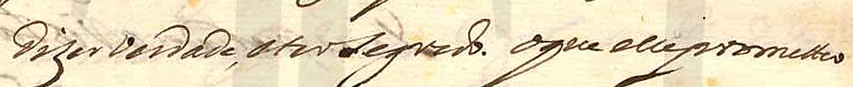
dizer verdade, e ter segredo o que elle prometteo
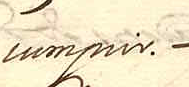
cumprir.
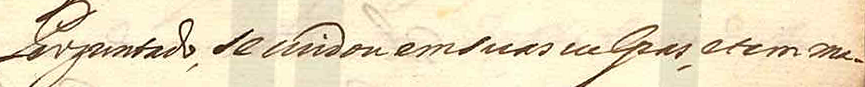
Perguntado se cuidou em suas culpas, e tem ma
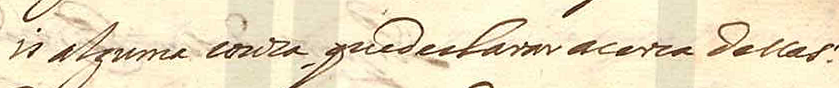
is alguma couza, que declarar acerca dellas
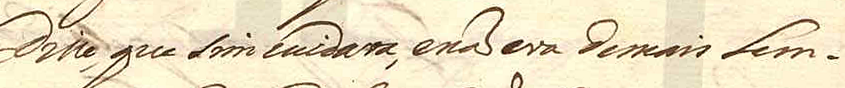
disse, que sim cuidara, e naõ era demais lem
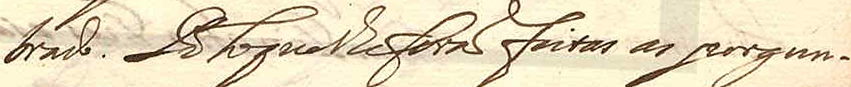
brado. Polo qual lhe forão feitas as pergun
